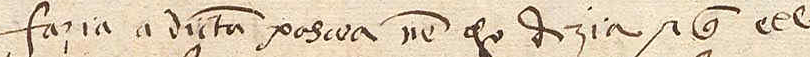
fazia a dic̄ta pascoa n̄e lho dezia e q̄ elle
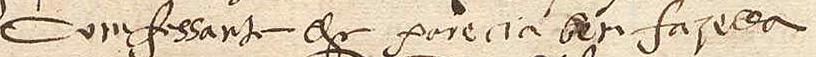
Comfessante lhe parecia bem fazella
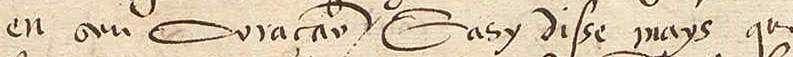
en seu Coração / E asy disse mays que
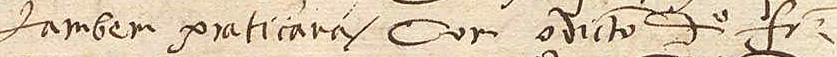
tambem praticaua / Com o dict̄o do frz̄
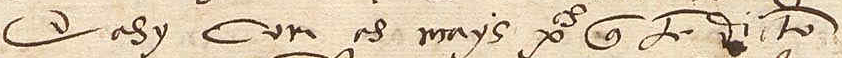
E asy Com as mays pas q̄ tē dict̄o
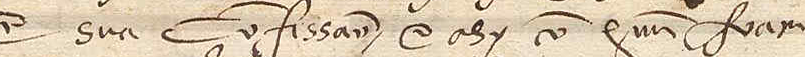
ē sua Cōfissaõ / e asy c̄o huū foam
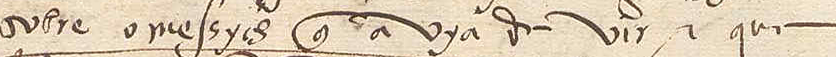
sobre o messyas q̄ avya de vir e que
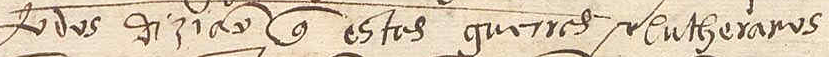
todos diziaõ q̄ estas guerras e lutheranos
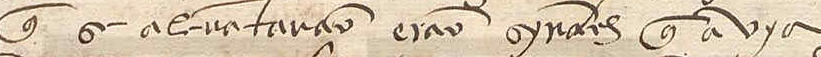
q̄ se aleuātauaõ eraõ synāes q̄ avya
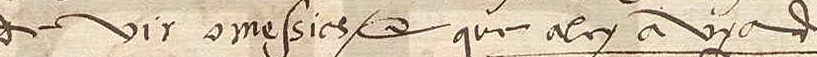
de vir o messias / e que a ley avya de
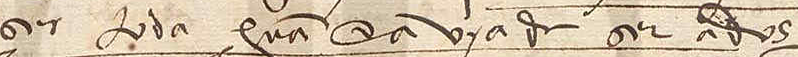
ser toda huā e avya de ser a dos
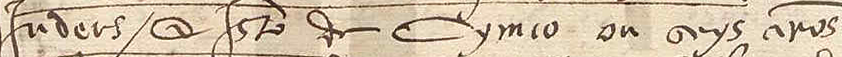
Judeus / e Jsto de Cymco ou seys an̄os
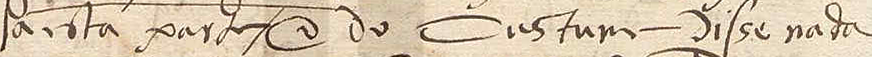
a esta parte /e do Custume disse nada
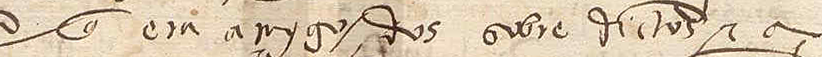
e q̄ era amygo / dos sobre dīctos e a
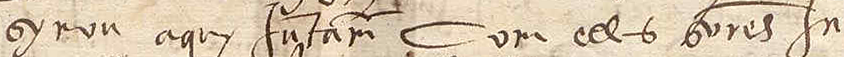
synou aquy Jūtamte Com elles s̄ores Jn
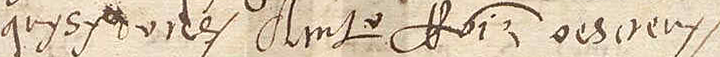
quysydores / Amto Rōiz o escreuy /
